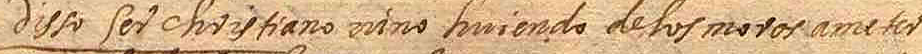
disso ser christiano uino huiendo de los moros a meter
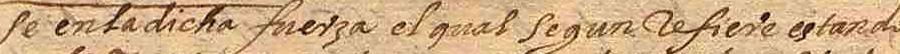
se en la dicha fuerza el qual segun Refiere estando
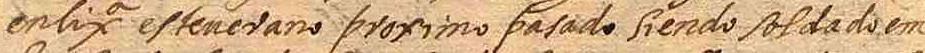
em lixa este uerano proximo pasado siendo soldado em
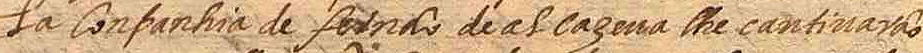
la Conpanhia de fernão de alcazeua lhe cautiuarão
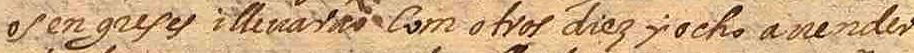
os engreses i lleuarão com otros diez y ocho a uender
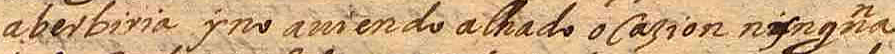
a berbiria y no auiendo alhado oCazion nynguna
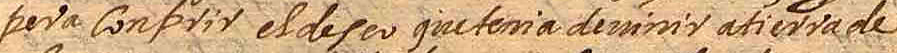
pera conprir el deseo que tenia de uinir a tierra de
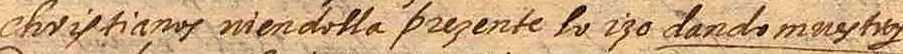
christianos uiendolla prezente lo izo dando muestras
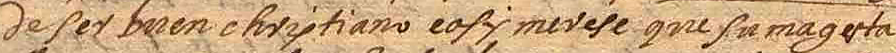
de ser bueno christiano e asy merese que su magesta
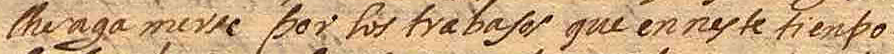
lhe aga merse por los trabajos que en neste tienpo
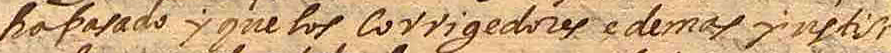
ha pasado y que los corrigedores e demas yustiss
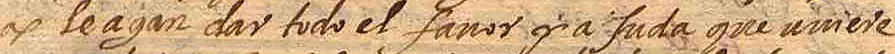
as le agan dar todo el fauor y aJuda que uuiere
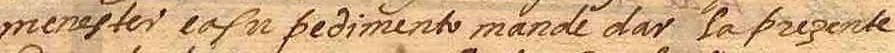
menester e a su pedimento mande dar la prezente
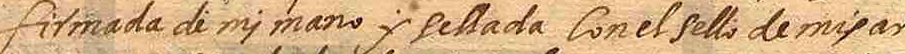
firmada de mj mano y sellada Con el sello de mis ar
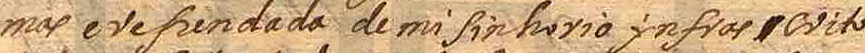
mas e refrendada de mi sinhorio ynfras _crito
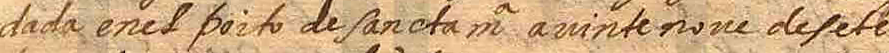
dada en el poito de sancta ma a uinte noue de setē
